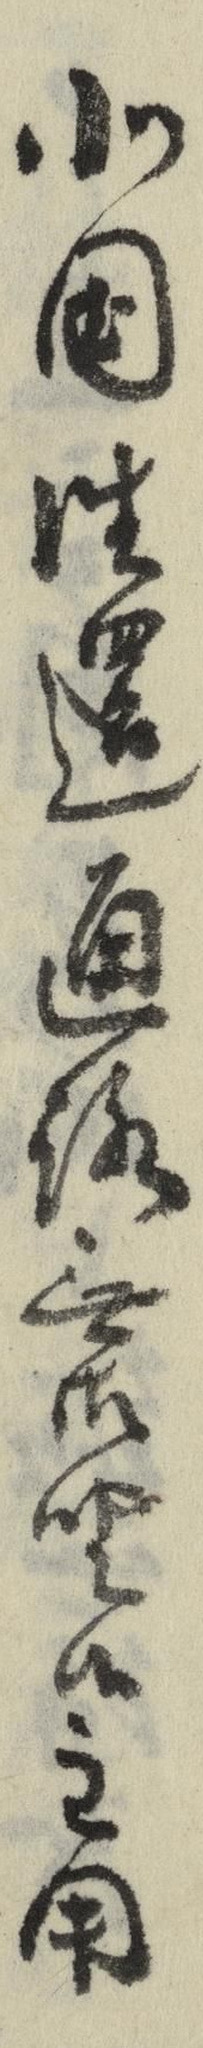北国往還通路無御坐候主用
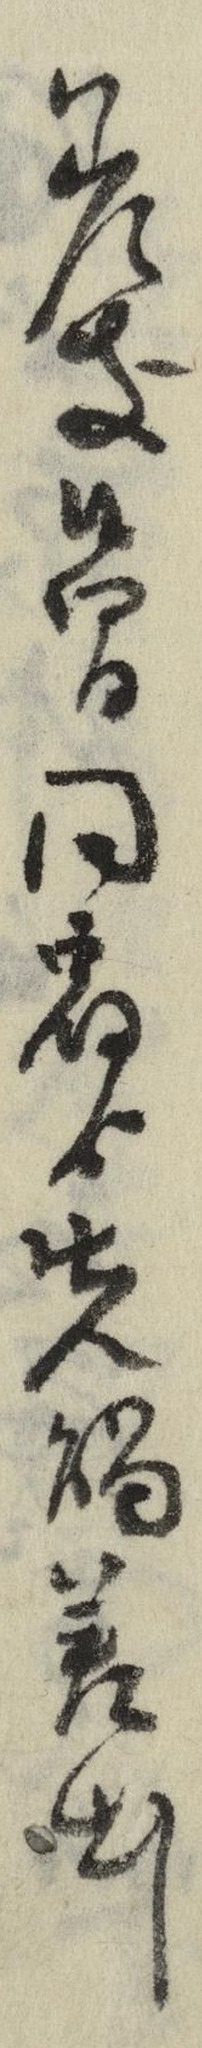差支候間同宿ゟ先触差出し
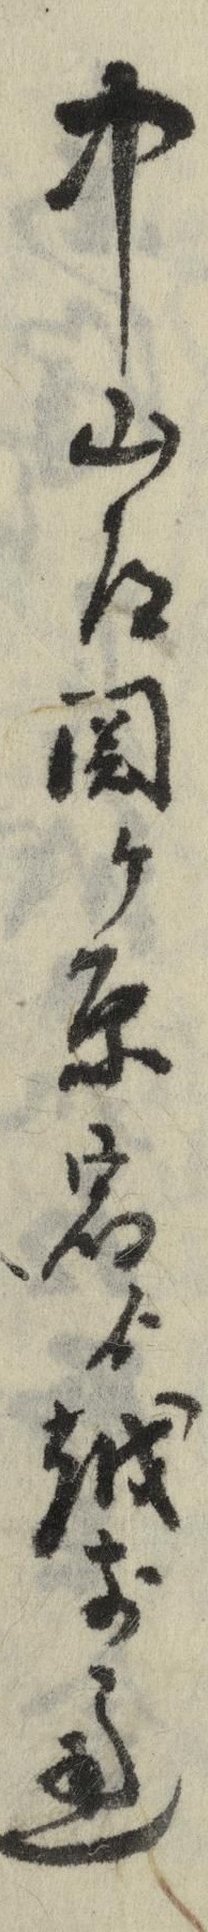中山道関ヶ原宿ゟ越前通

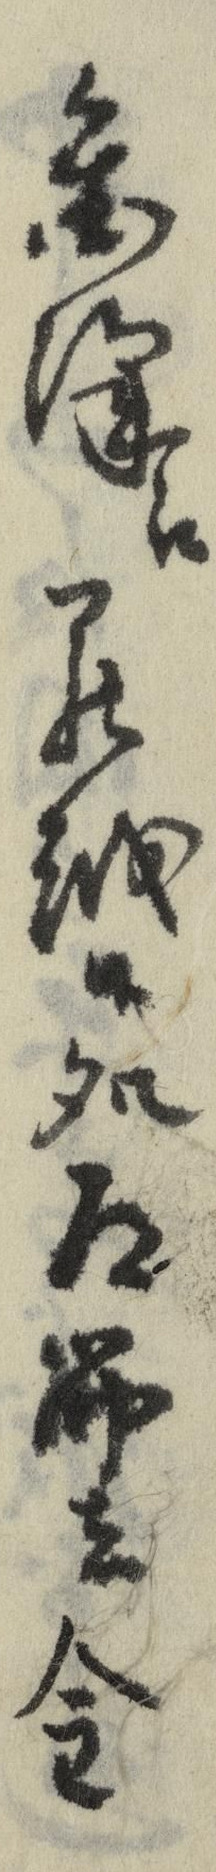金沢江罷越候処道筋者金
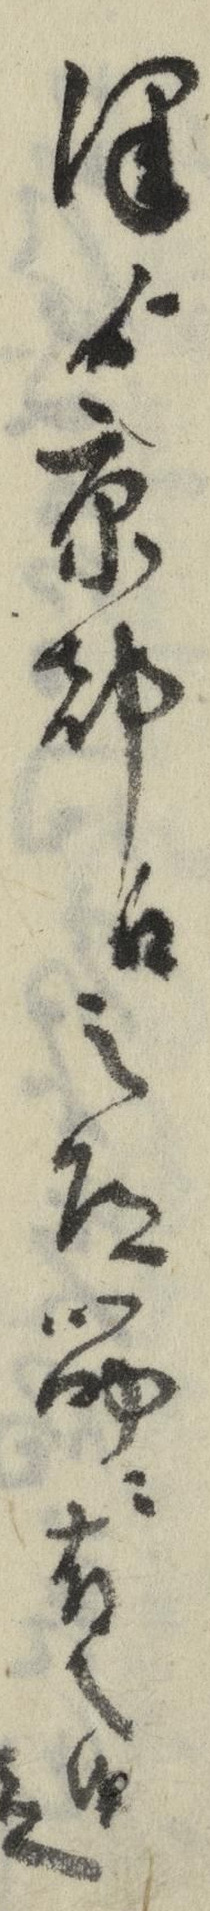沢ゟ京都江之道筋二有之候段
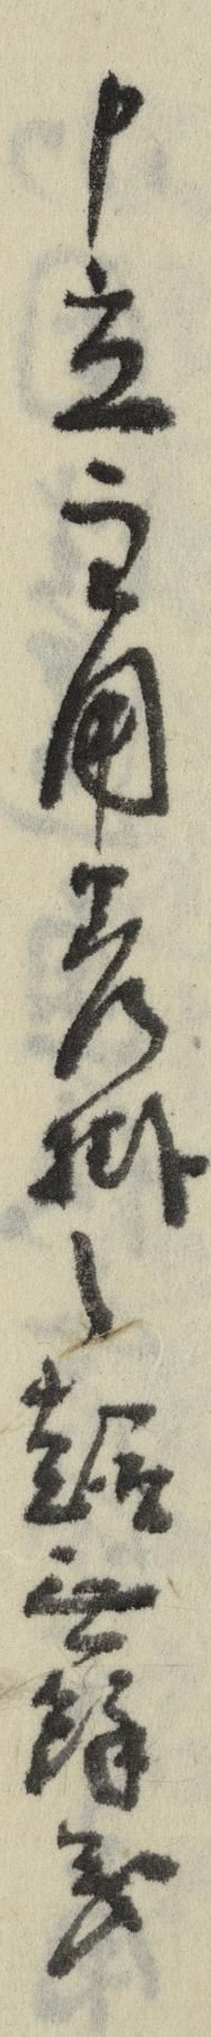申立主用差掛之趣無余義
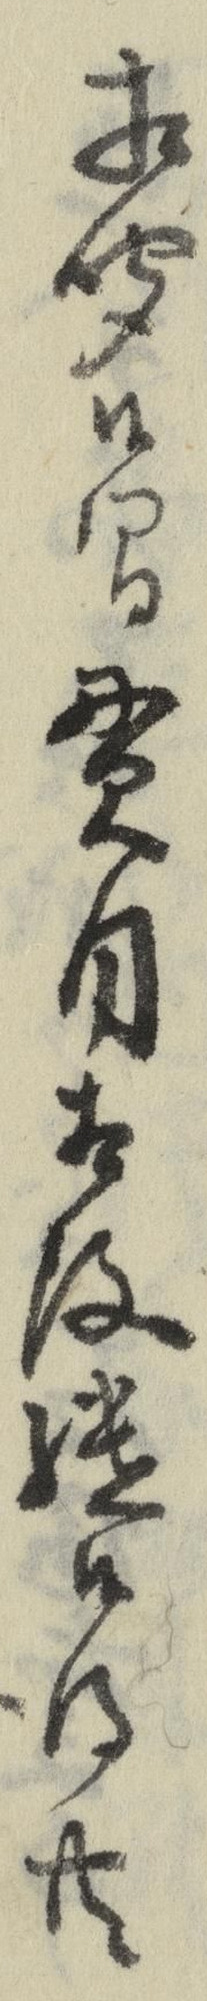相聞候間貫目相改継候得共
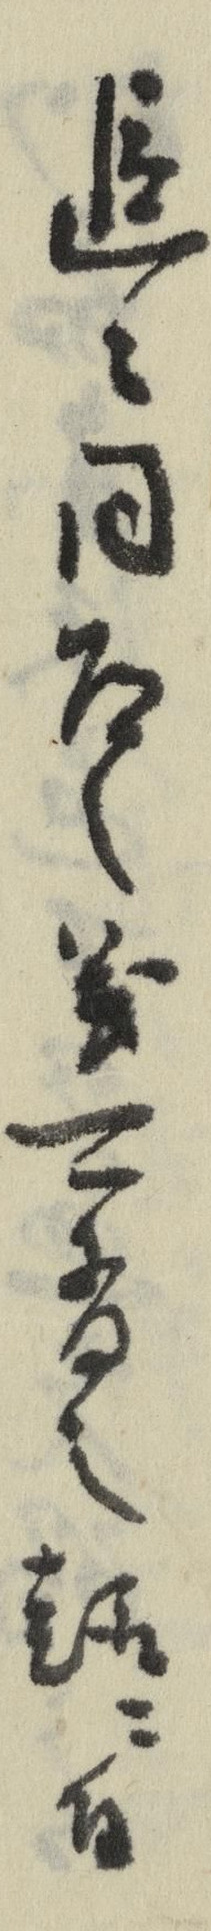追々同道之義可有之趣二付
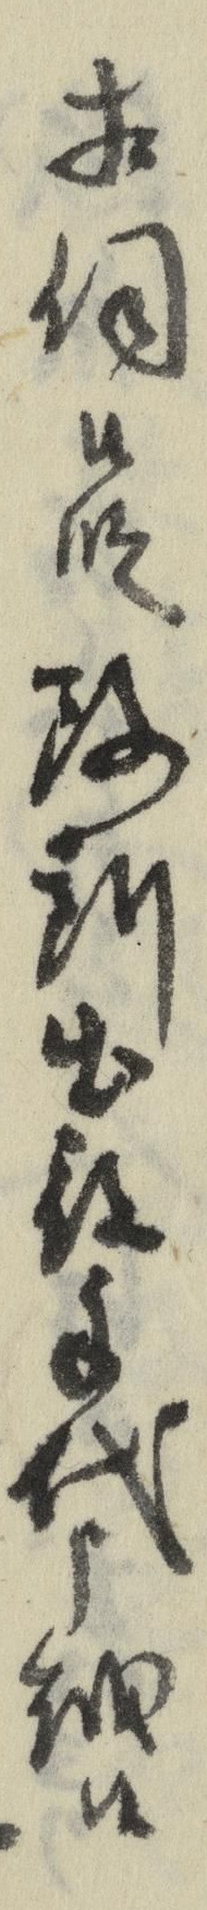相伺候段改所出役手代申越候已上
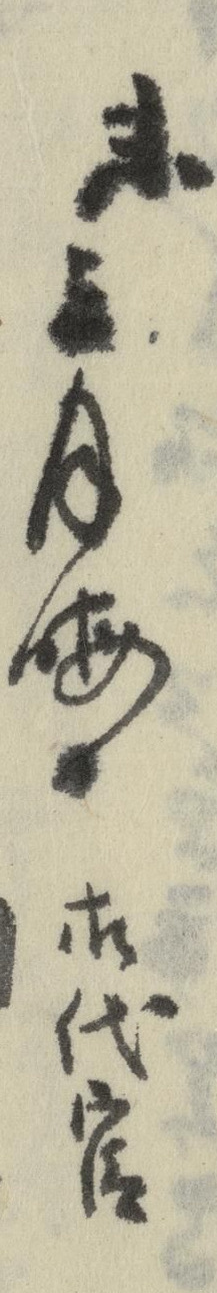未三月晦日御代官
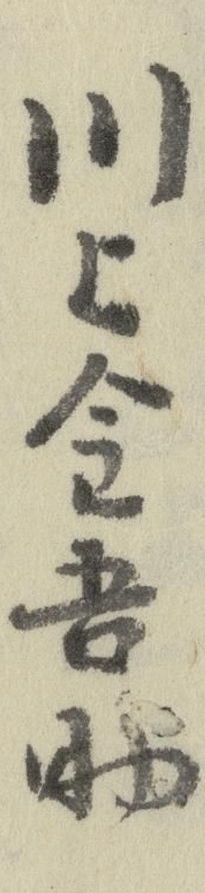川上金吾助
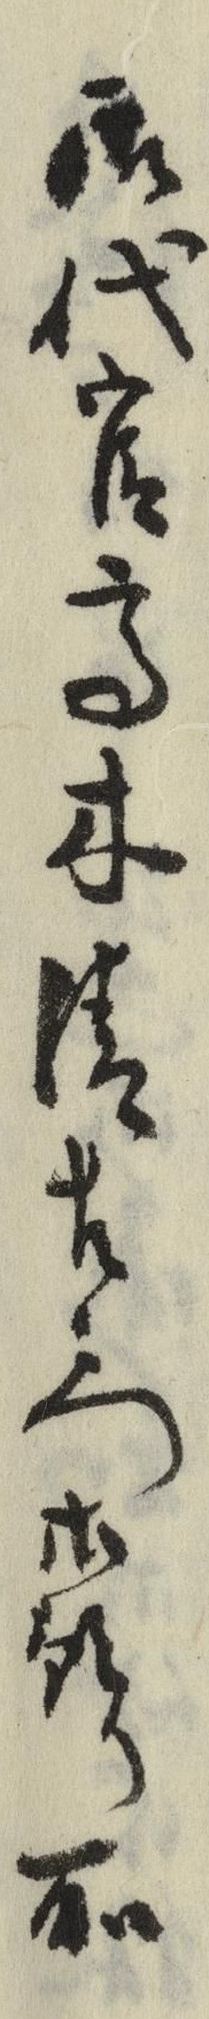御代官高木清左衛門御預り所
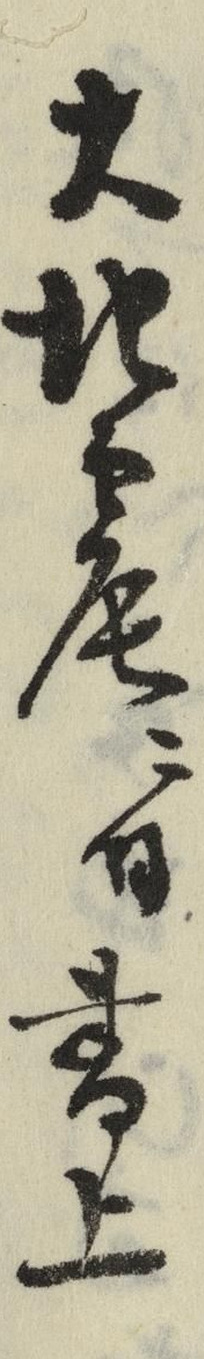大地震二付書上
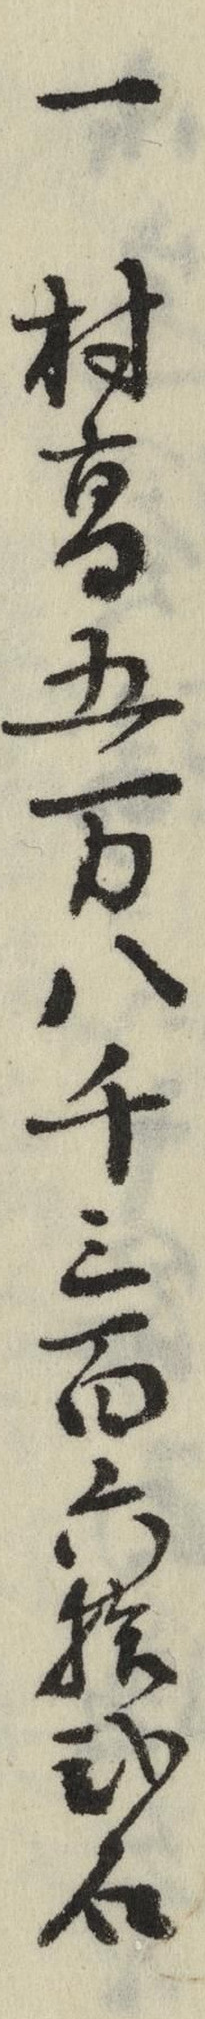一村高五万八千三百六拾弐石
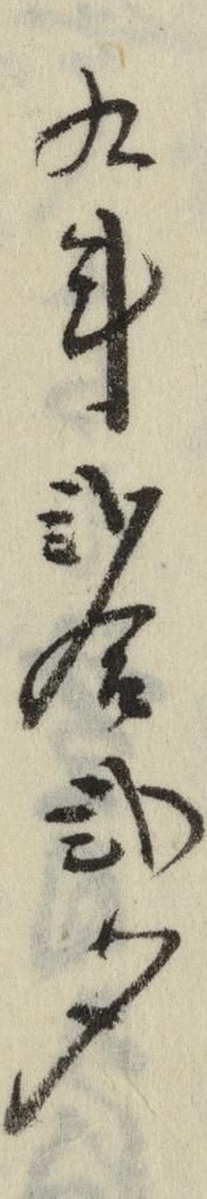九斗弐合弐夕
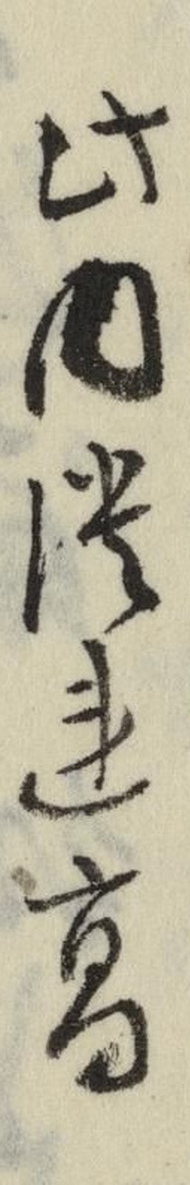此内潰れ高
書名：信州大地震一件之冩　丁未弘化四年三月吉日
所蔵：東京大学地震研究所図書室 Earthquake Research Institute Library, The University of Tokyo, JAPAN
